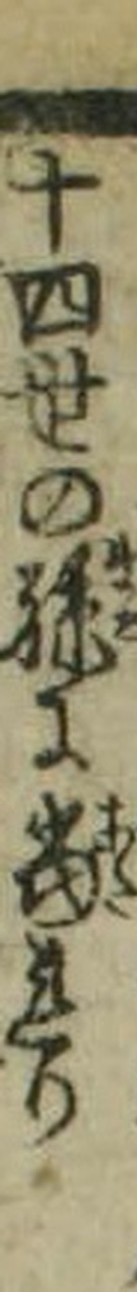十四世の孫に当れり
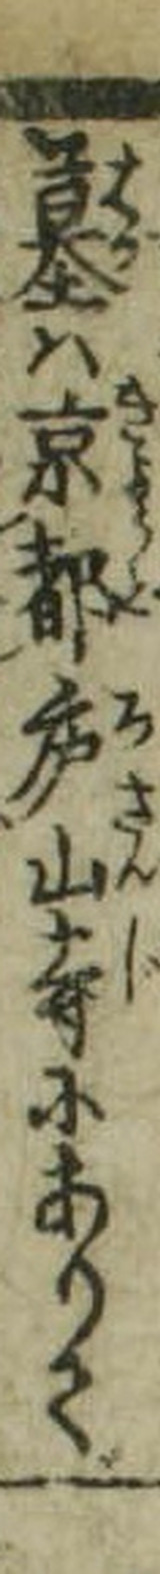墓は京都廬山寺にありて
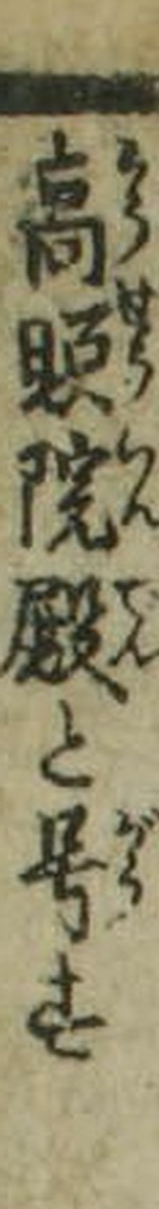高照院殿と号す
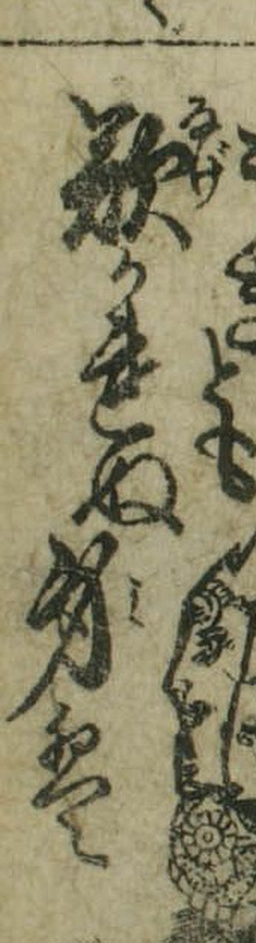歎かれぬ身は

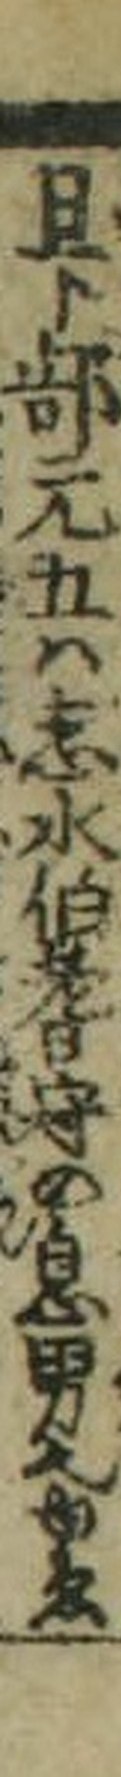日下部元五は志水伯耆守の息男也ゆゑ
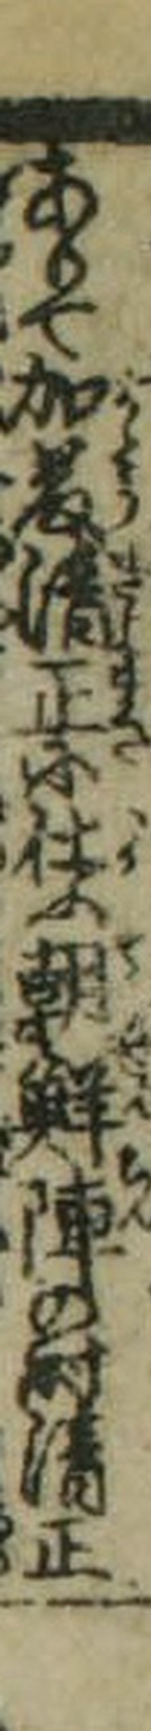ありて加藤清正に仕ふ朝鮮陣の時清正
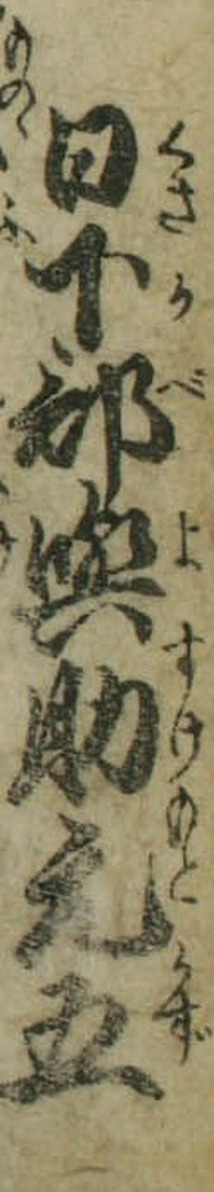日下部與助元五
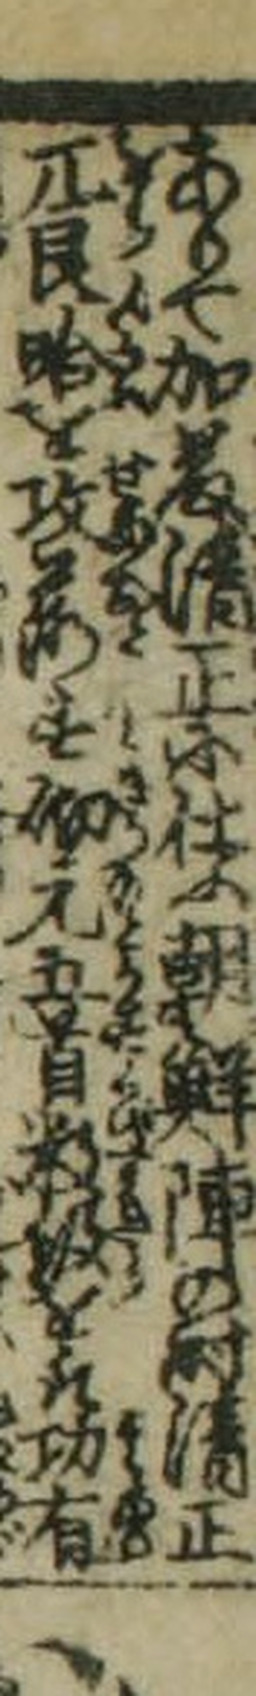兀良哈を攻落す砌元五首数級を取功有
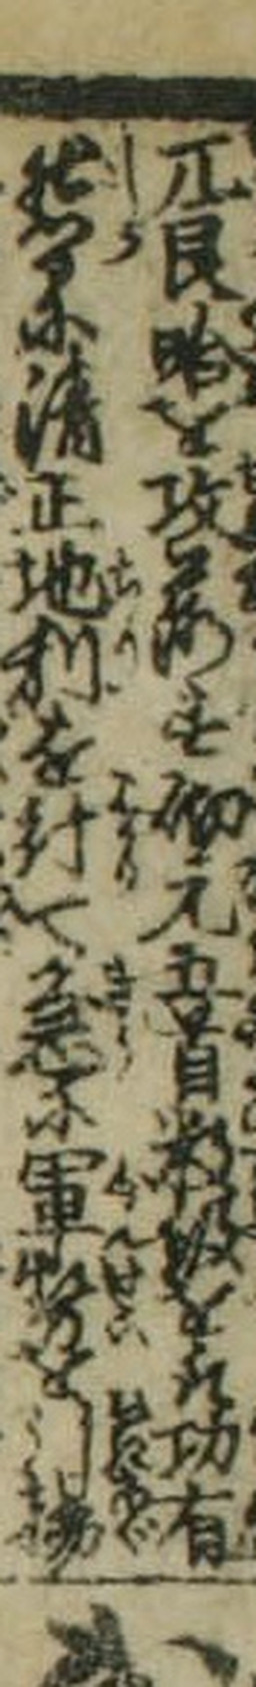然るに清正地利を計て急に軍勢を引揚
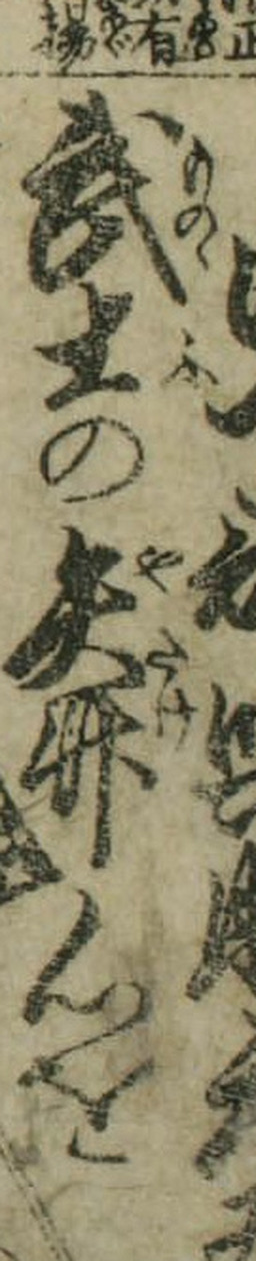武士の矢竹心を
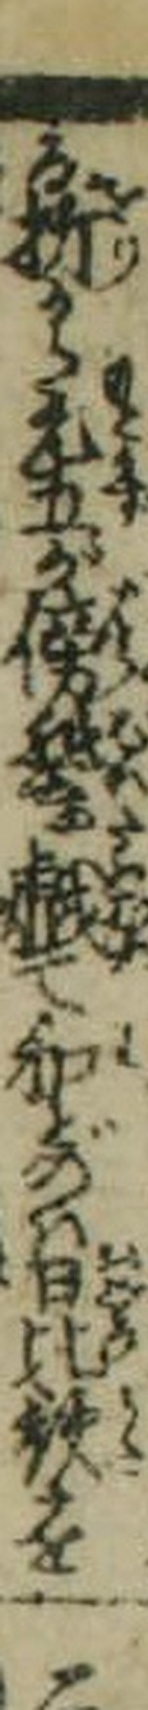る折から元五が傍輩戯て和どのは日比歌を
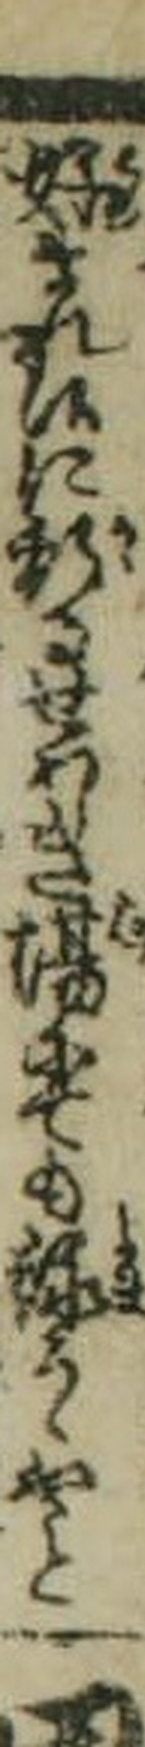好まれ候に斯るせはしき場にても詠るゝやと
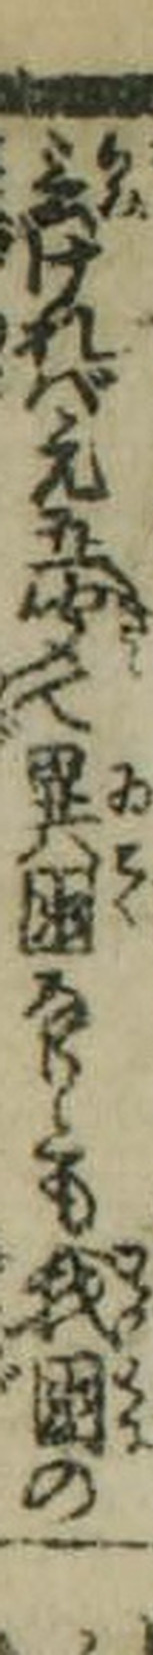言ければ元五聞て異国なりとも我国の
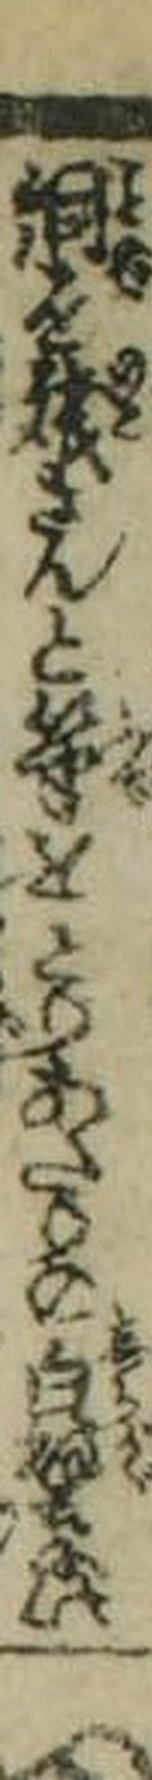詞を残さんと筆をとりあたりの白壁に此
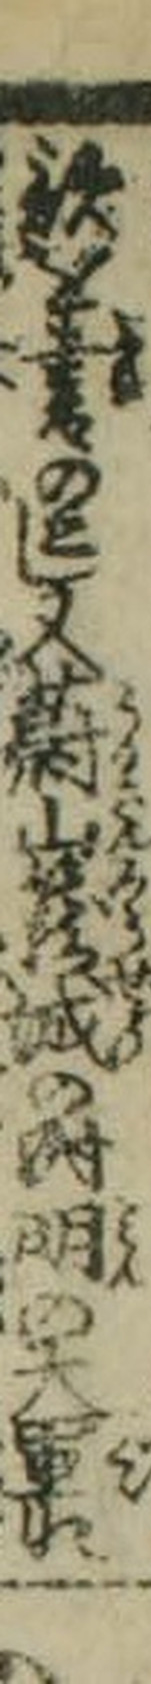歌を書のこし又蔚山籠城の時明の大軍に
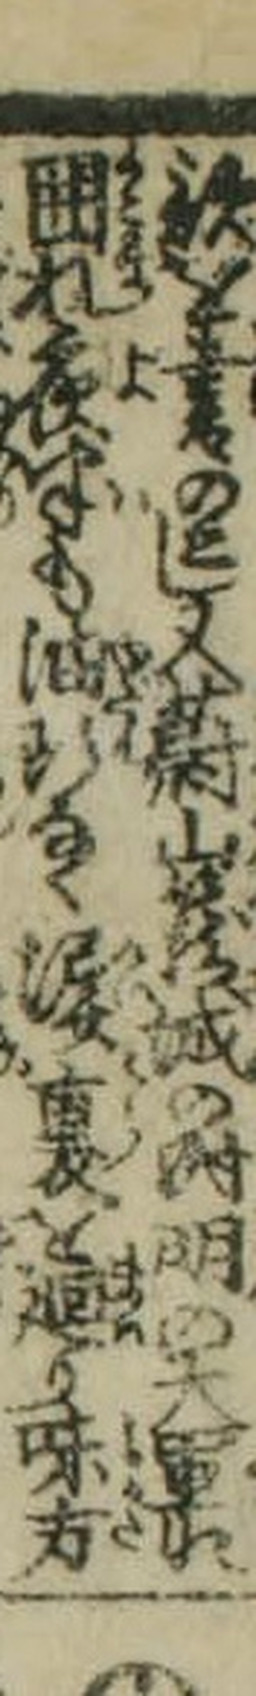囲れ夜半も油断なく塀裏を廻り味方
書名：續英雄百人一首
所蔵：東京学芸大学附属図書館
